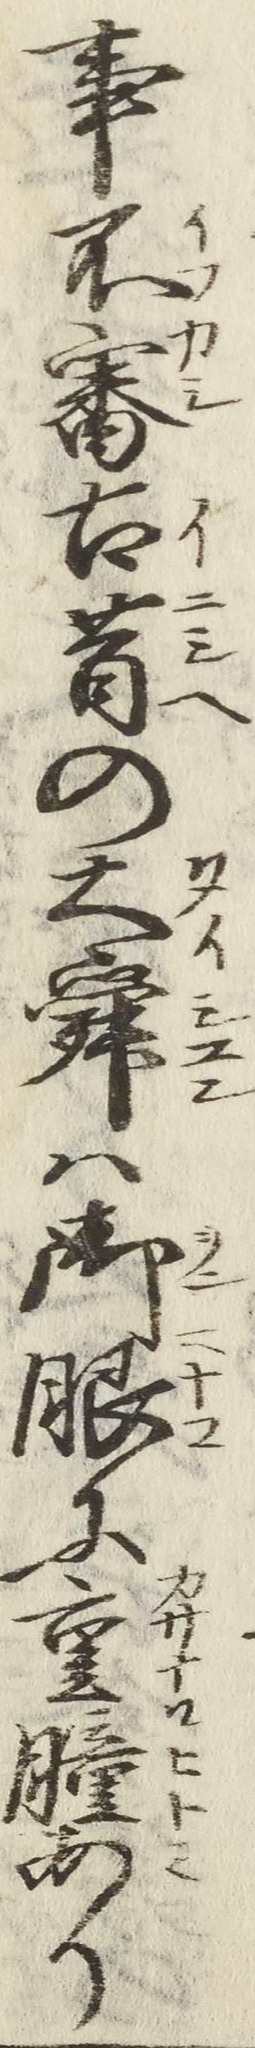事不審古昔の大舜は御眼に重瞳あり

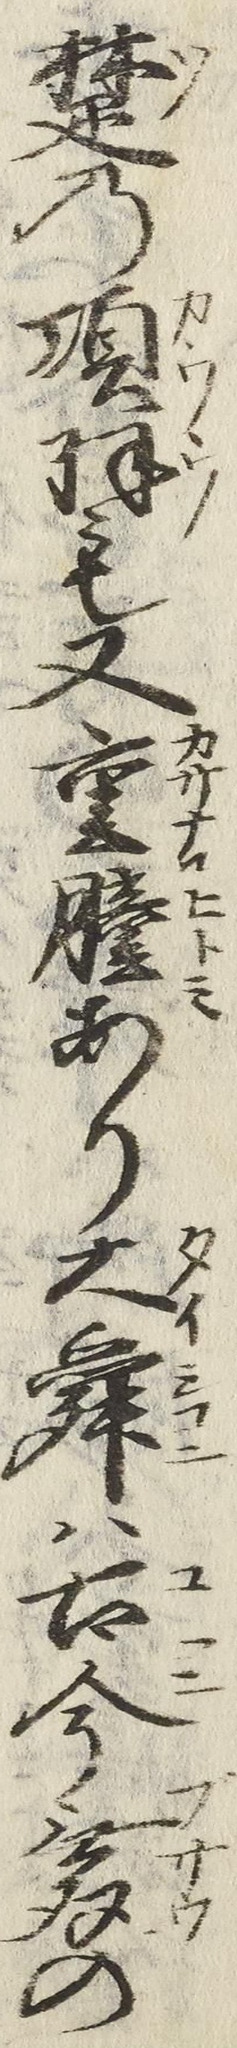楚の項羽も又重瞳あり大舜は古今無双の
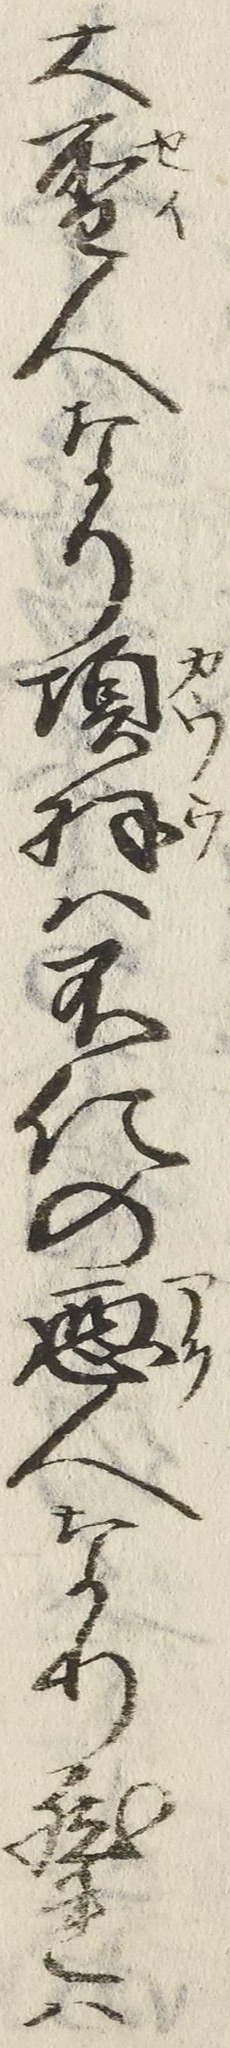大聖人なり項羽は不仁の悪人なり然れは
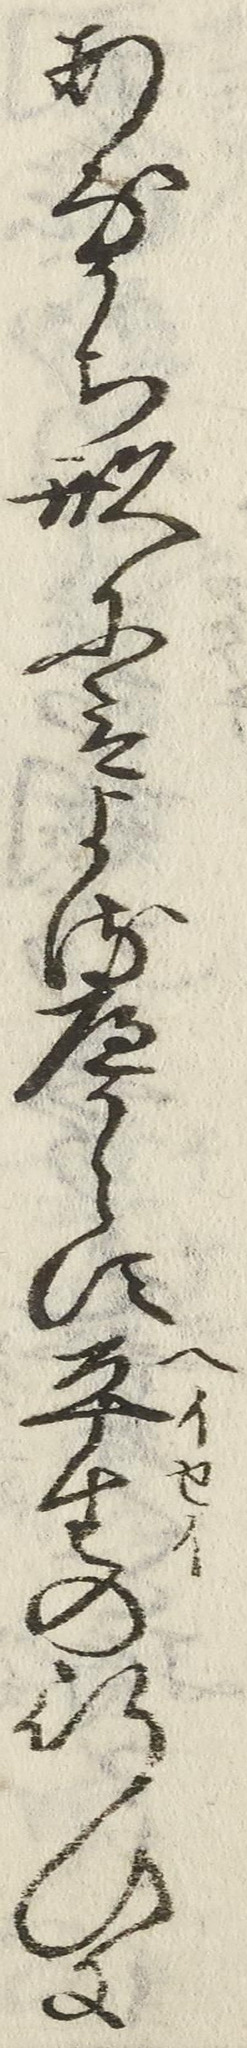あなかち形にはよるへからす平生の行ひに
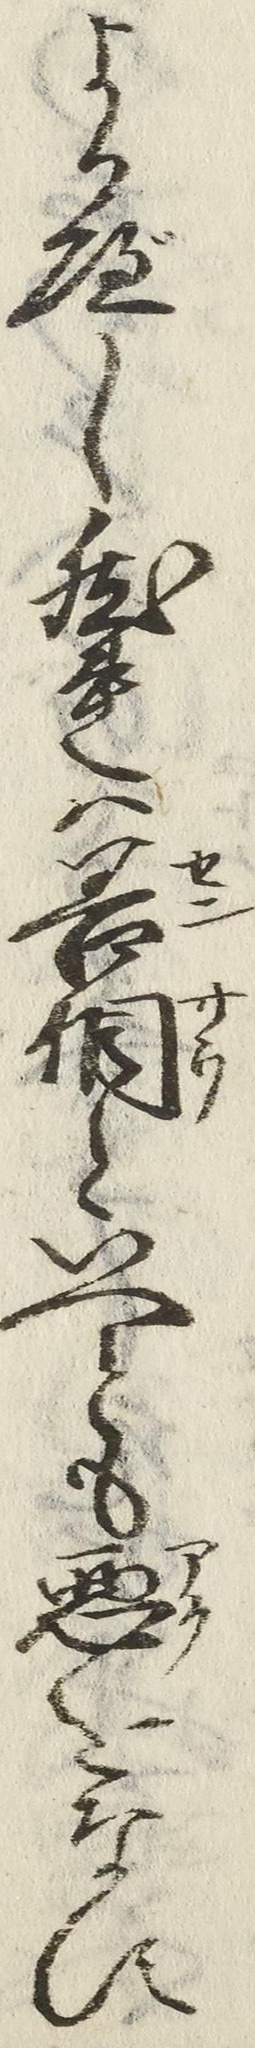よるべし然れは善相といへとも悪をなす
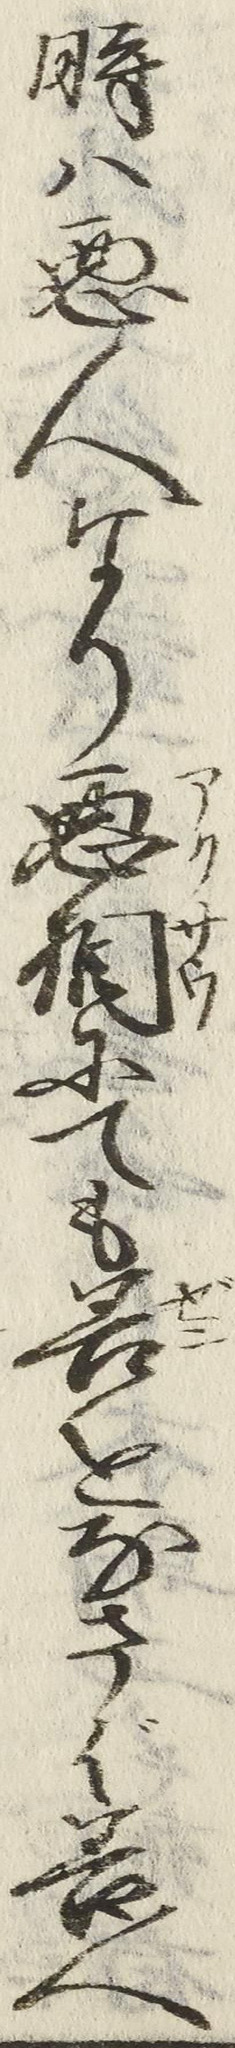時は悪人なり悪相にても善をなさば善人
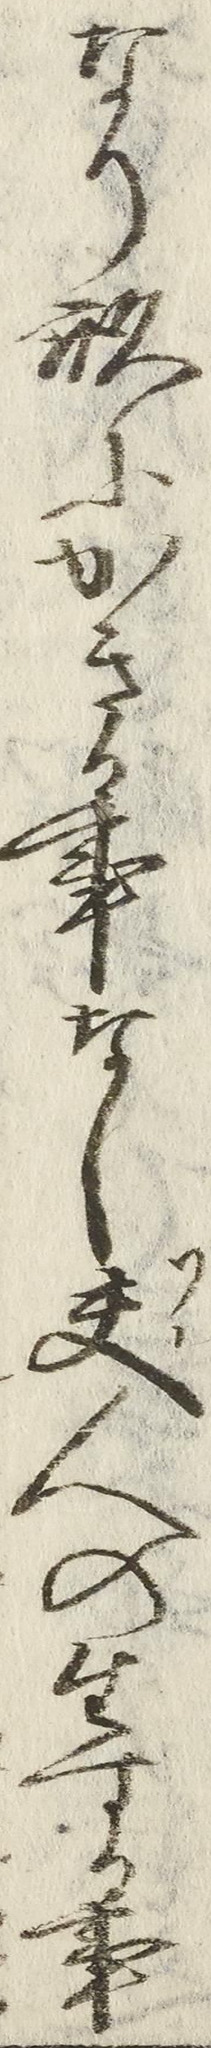なり形にかきる事なし夫人の生する事
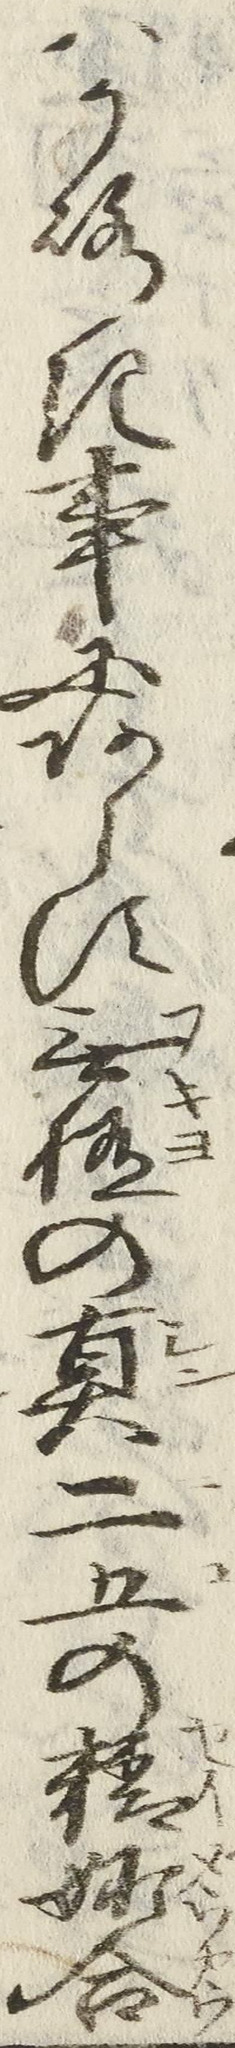はかろき事にあらす無極の真二五の精妙合
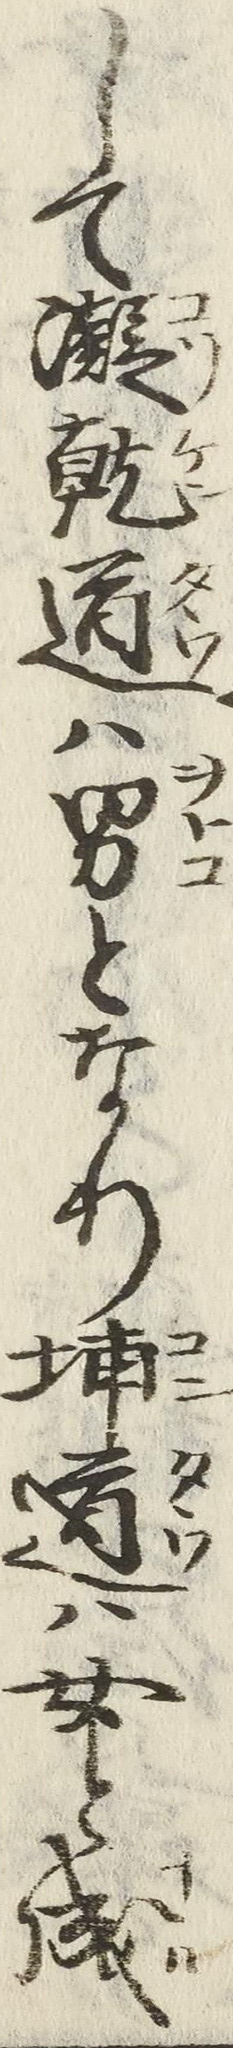して凝乾道は男となり坤道は女と成
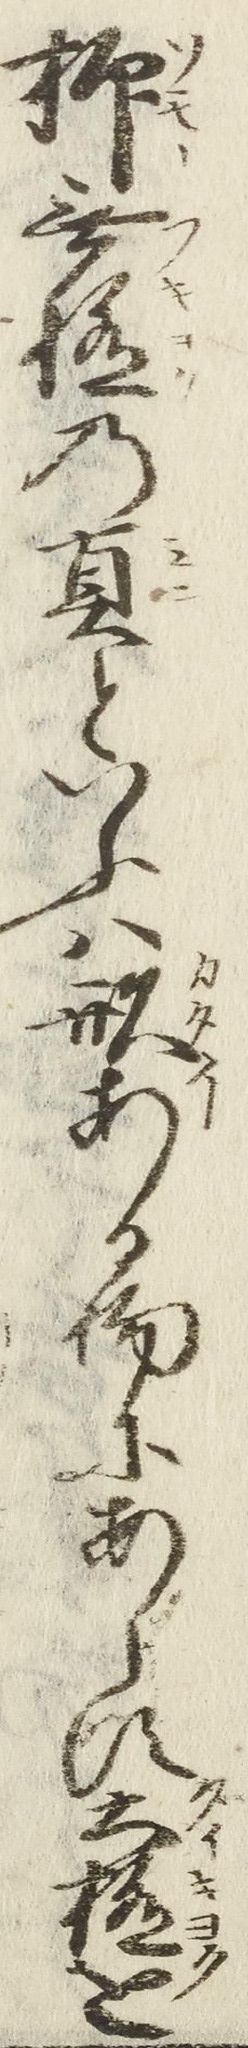抑無極の真といふには形ある物にあらす大極を
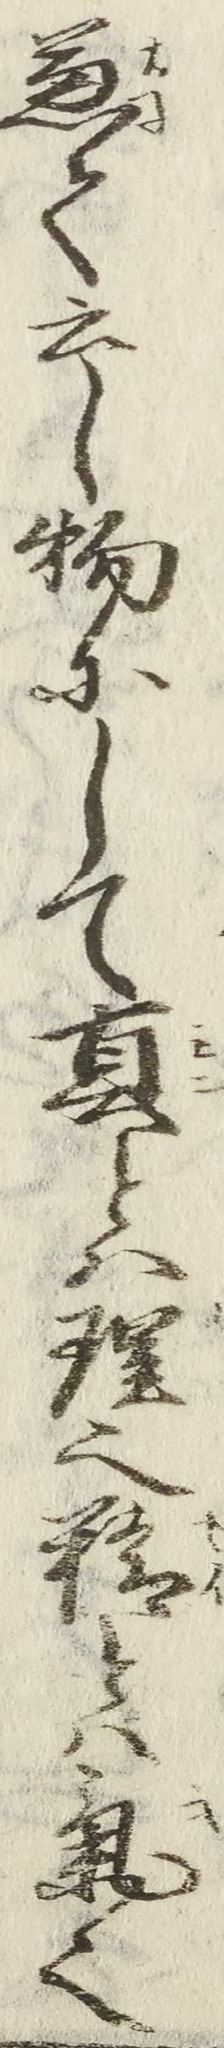兼て云し物にして真とは理也精とは気之
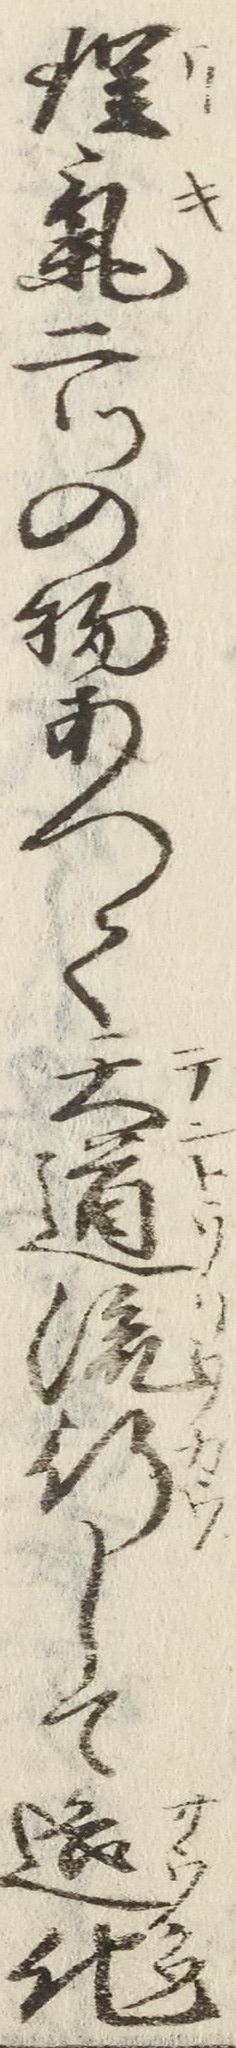理気二つの物あつて天道流行して造化
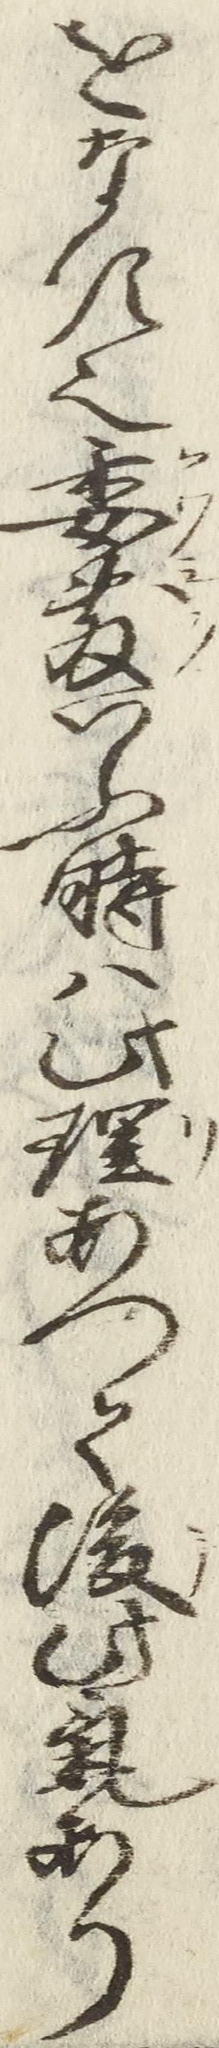をなす也委敷いふ時は此理あつて後此気あり
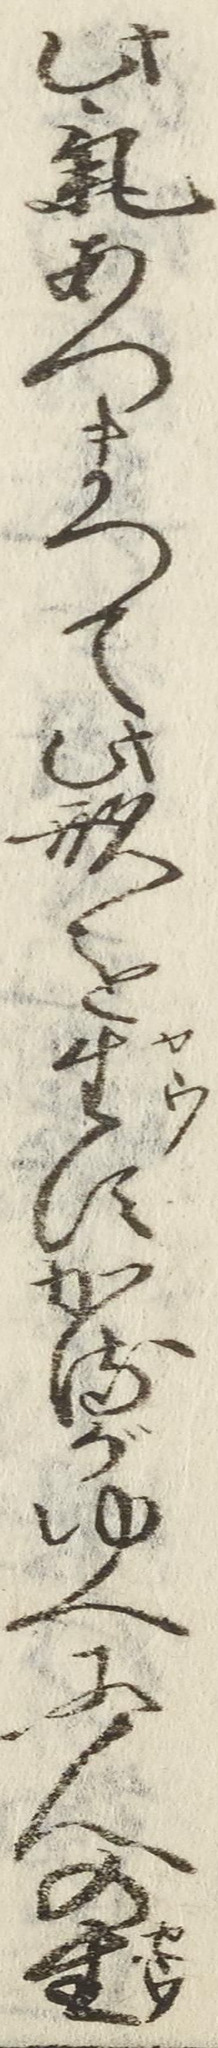此気あつまつて此形を生すかるがゆへに人の生
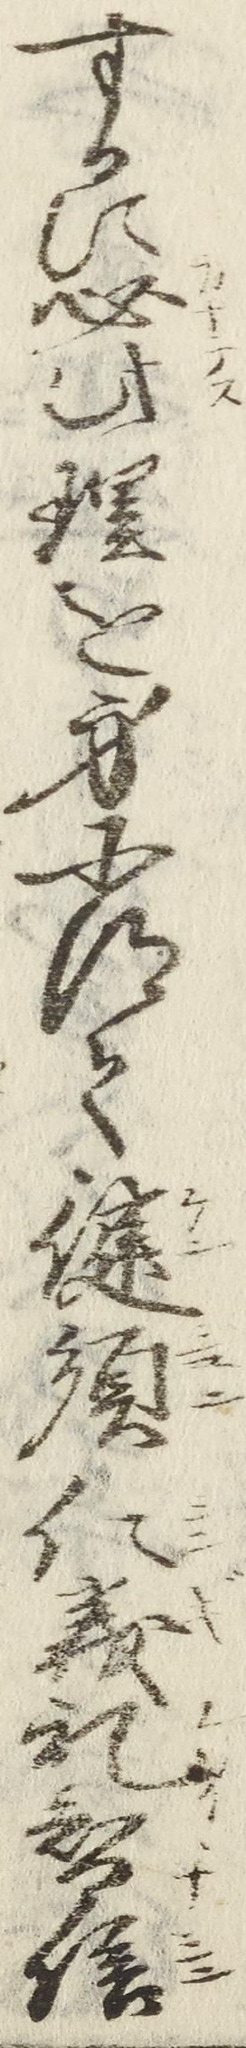するに必此理を身に得て健須仁義礼智信
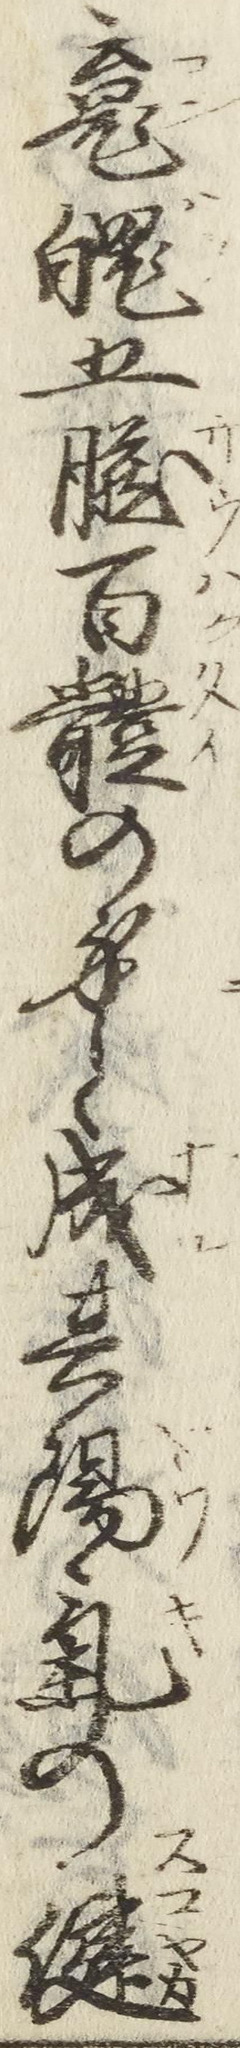魂魄五臓百体の身と成其陽気の健
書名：天地或問珍　地
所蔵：東京大学地震研究所図書室 Earthquake Research Institute Library, The University of Tokyo, JAPAN
